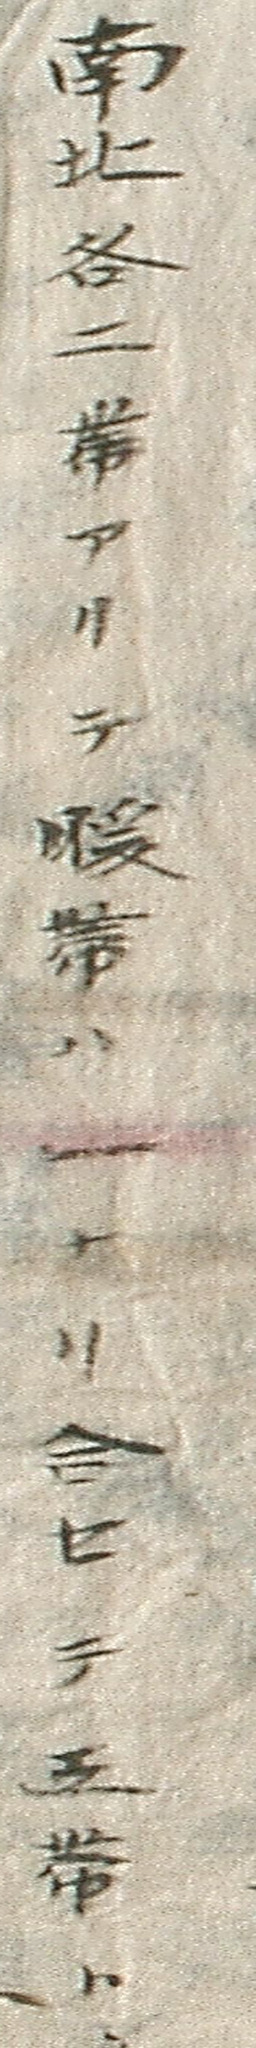南北各ニ帯アリテ暖帯ハ一ナリ合セテ五帯ト
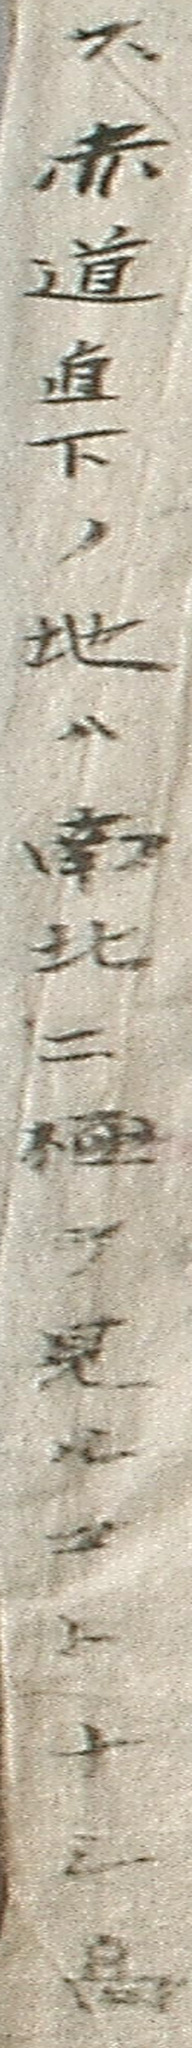ス赤道直下ノ地ハ南北ニ極ヲ見ルコトナシ高

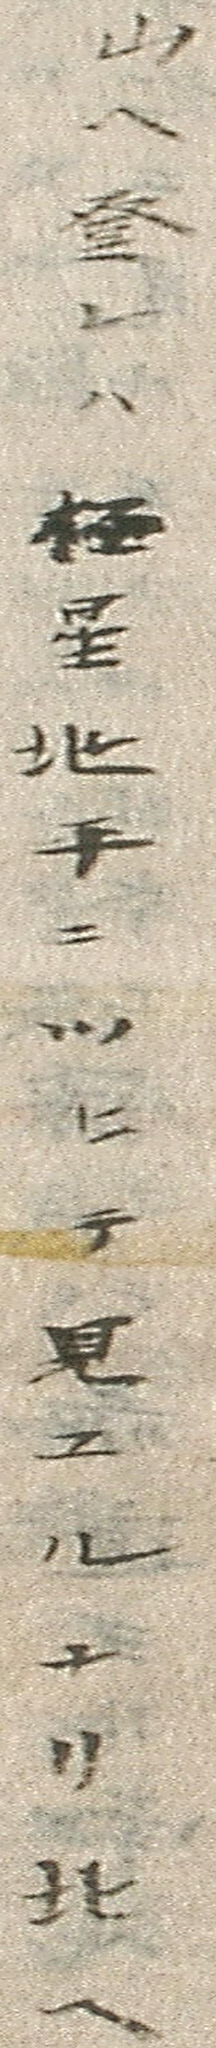山ヘ登レハ極星地平ニツヒテ見ユルナリ北ヘ
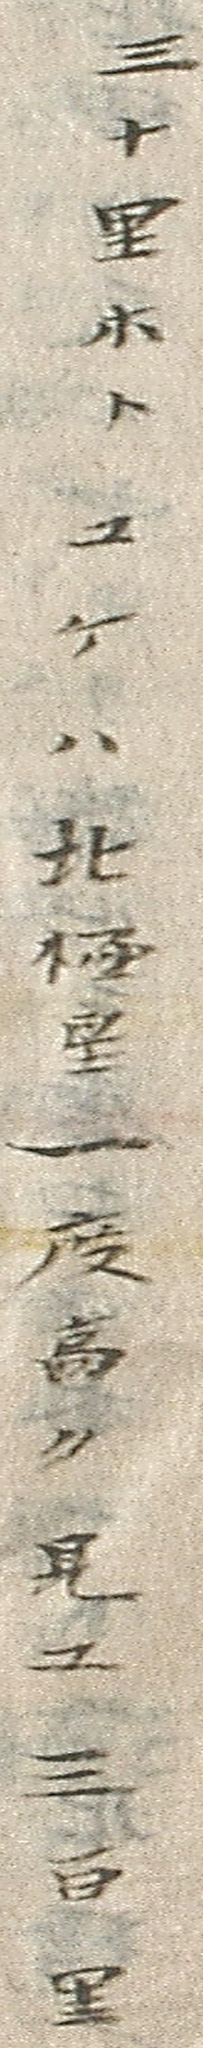三十里ホトユケハ北極星一度高ク見ユ三百里
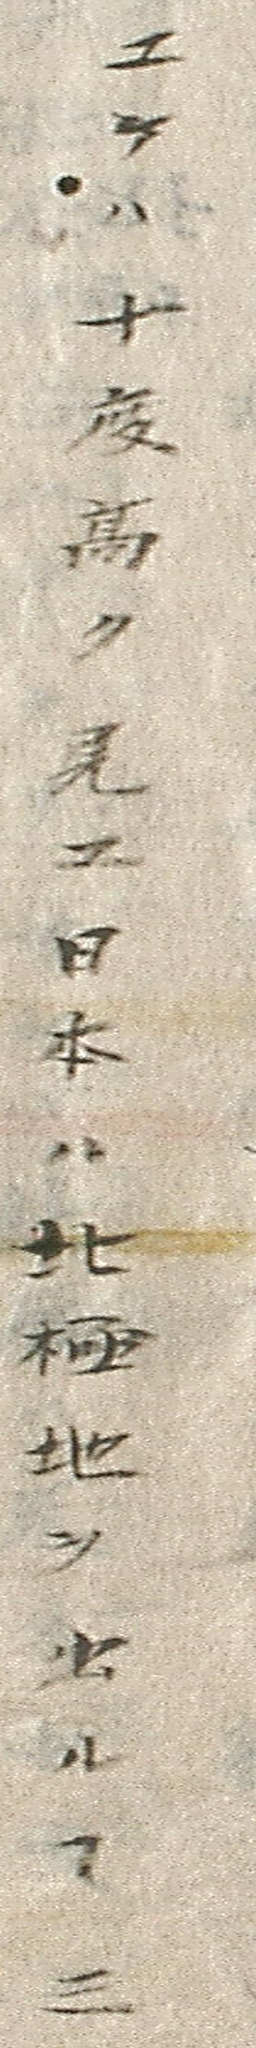ユケハ十度高ク見ユ日本ハ北極地ヲ出ルヿ三
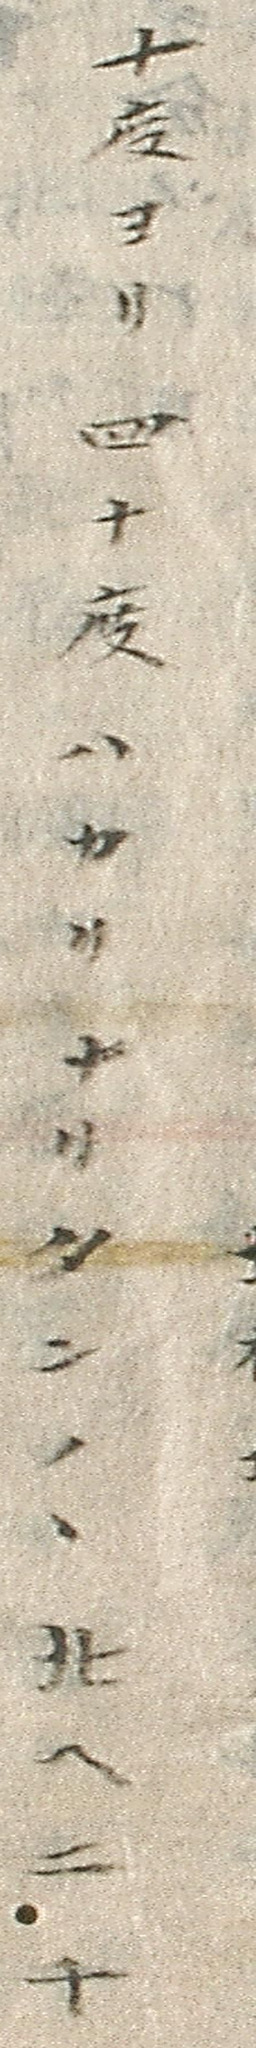十度ヨリ四十度ハカリナリタンノヽ北ヘニ千
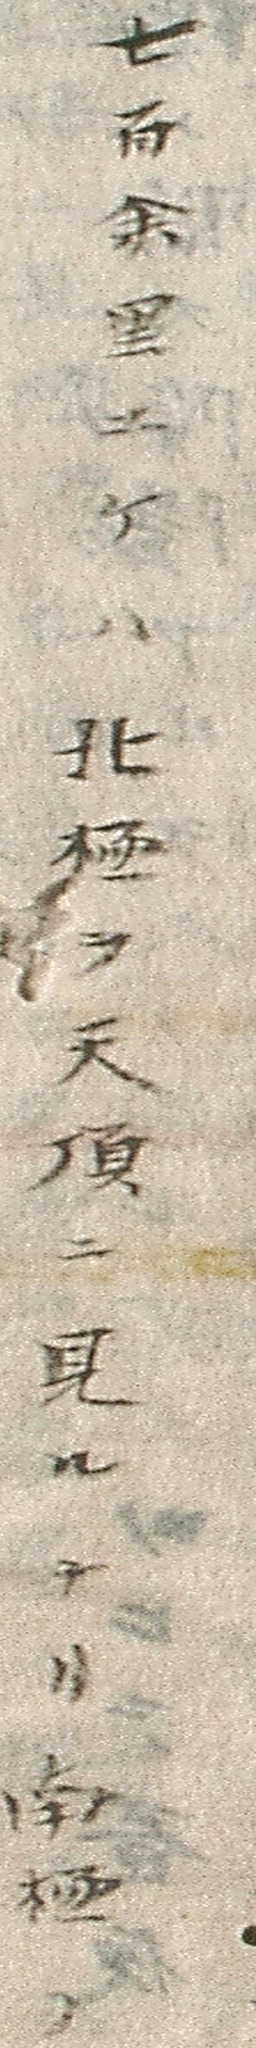七百余里ユケハ北極ヲ天頂ニ見ルナリ南極ノ
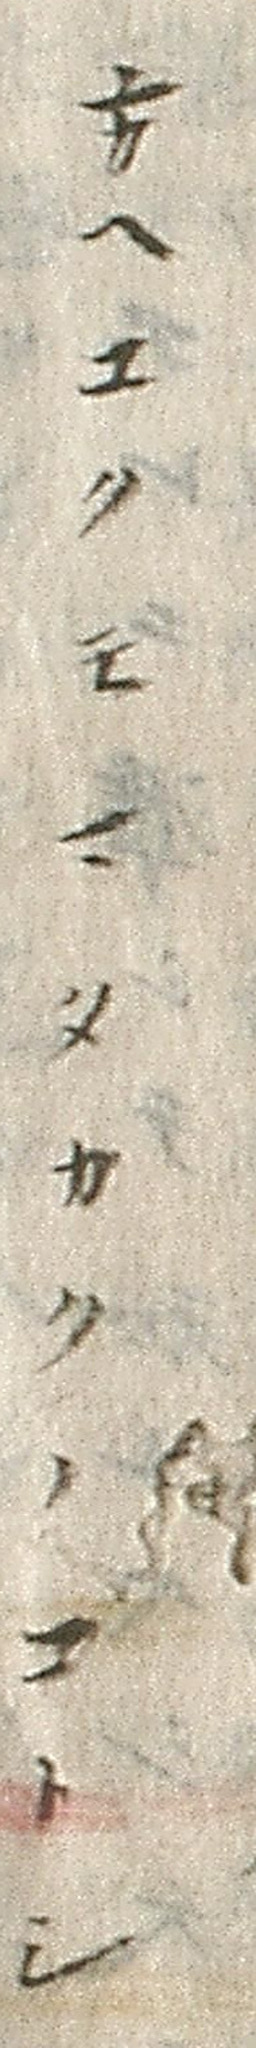方ヘユクモマタカクノゴトシ
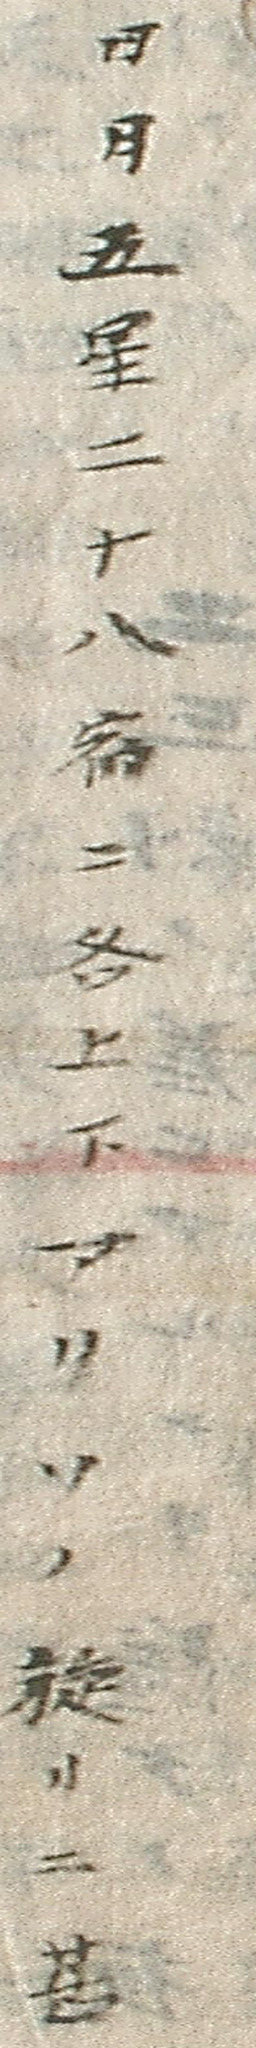日月五星ニ十八宿ニ各上下アリソノ旋リニ甚
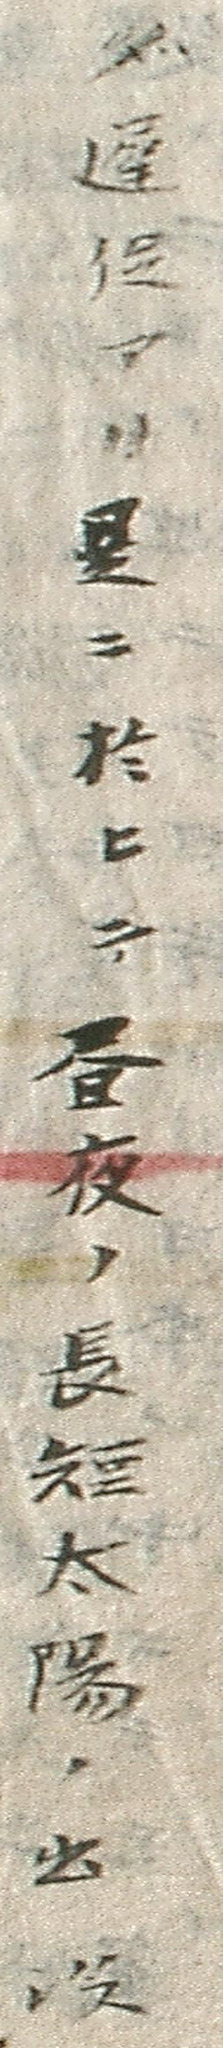ダ遅促アリ是ニ於ヒテ昼夜ノ長短太陽ノ出没
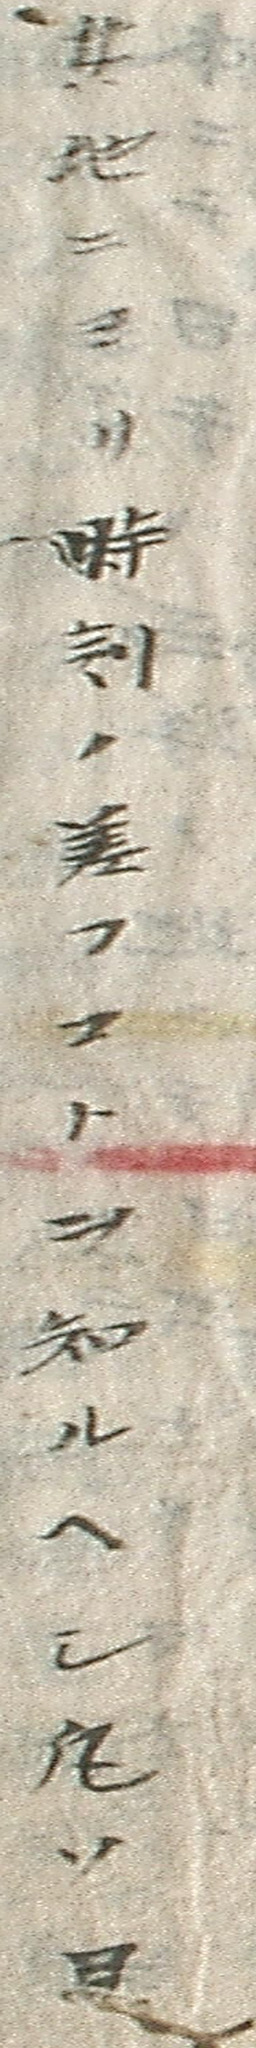其地ニヨリ時刻ノ差フコトヲ知ルヘシ凡ソ日

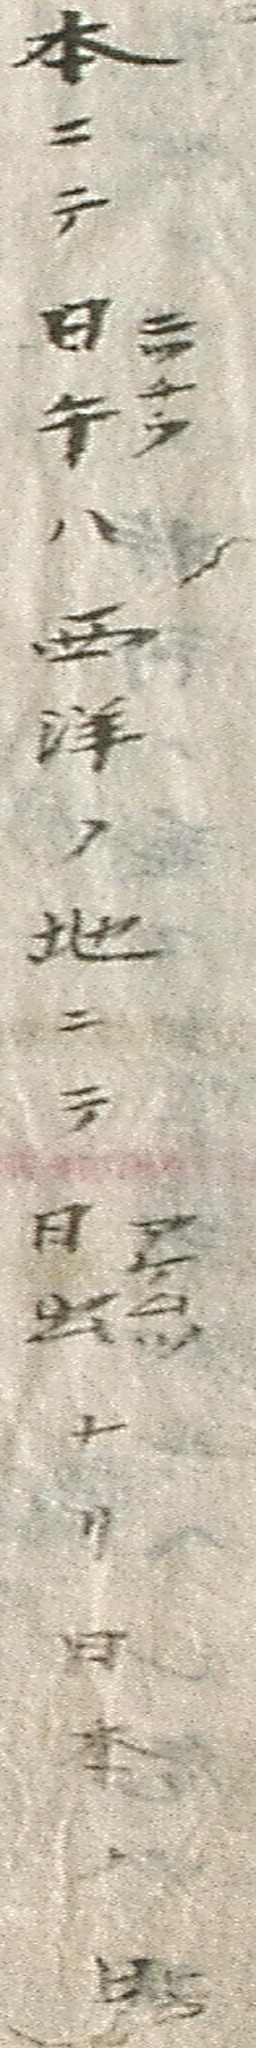本ニテ日午は西洋ノ地ニテ日出ナリ日本ノ日
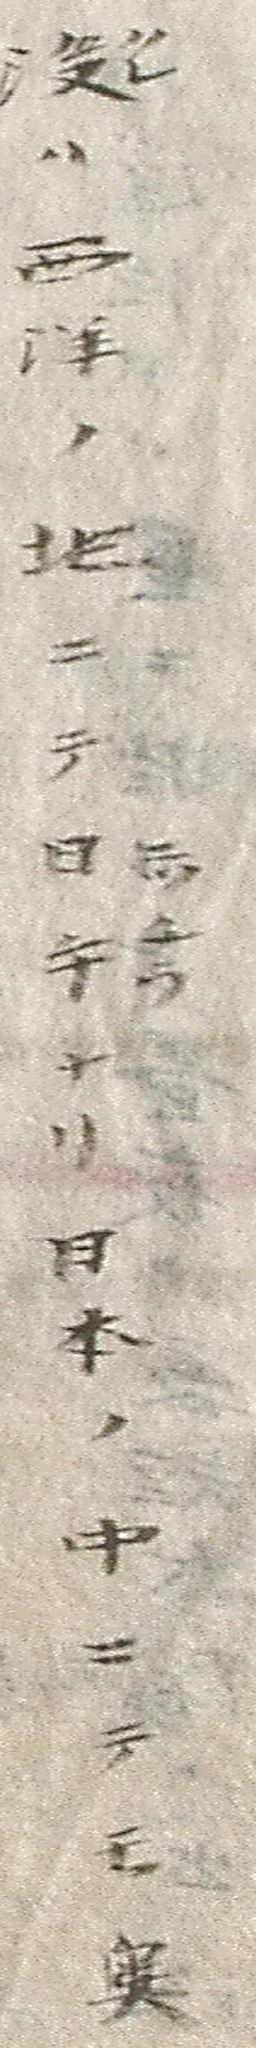没は西洋ノ地ニテ日午ナリ日本ノ中ニテモ奥
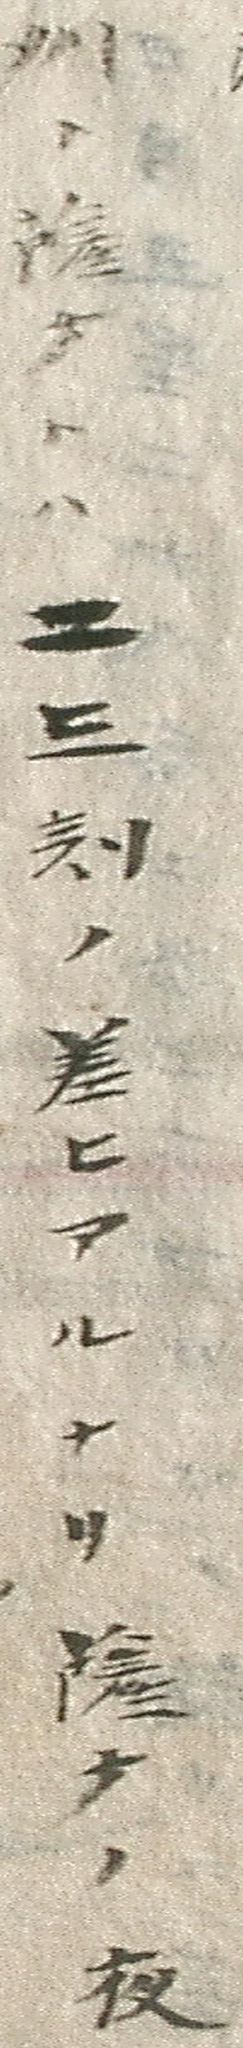州ト薩摩トハ二三刻ノ差ヒアルナリ薩摩ノ夜
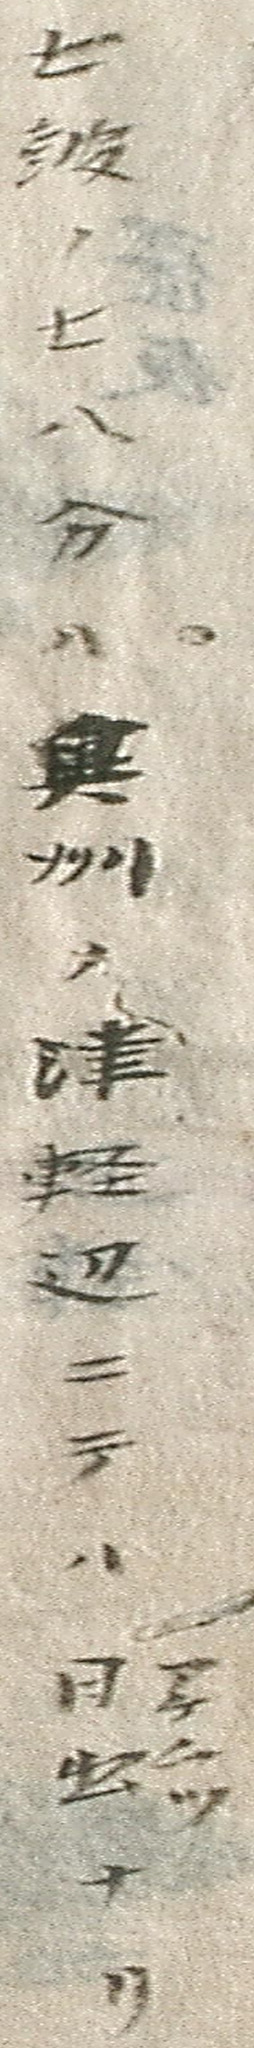七皷ノ七八分ハ奥州ノ津軽辺ニテハ日出ナリ
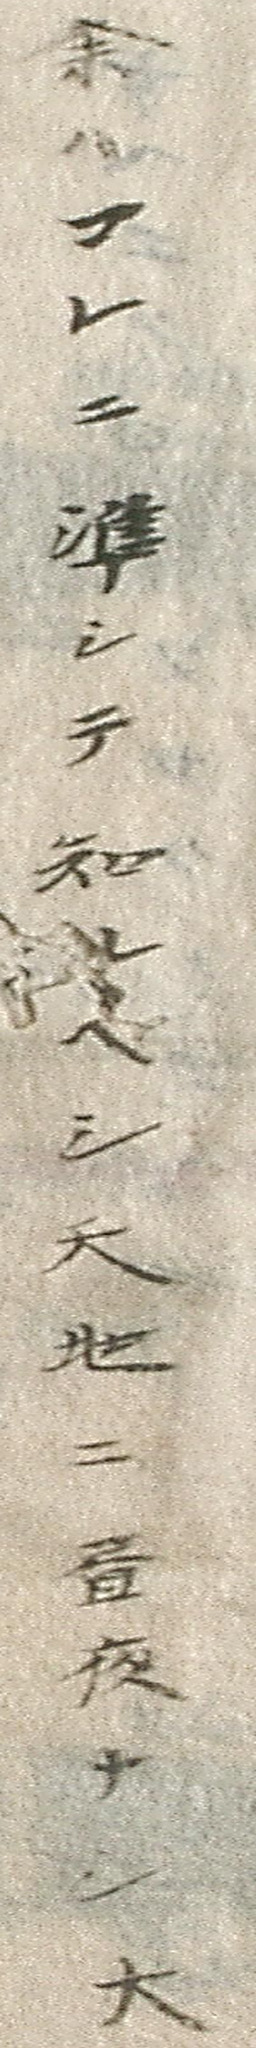余ルコレニ準シテ知ルベシ天地ニ昼夜ナシ大
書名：天學便蒙図説
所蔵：東京大学地震研究所図書室 Earthquake Research Institute Library, The University of Tokyo, JAPAN
